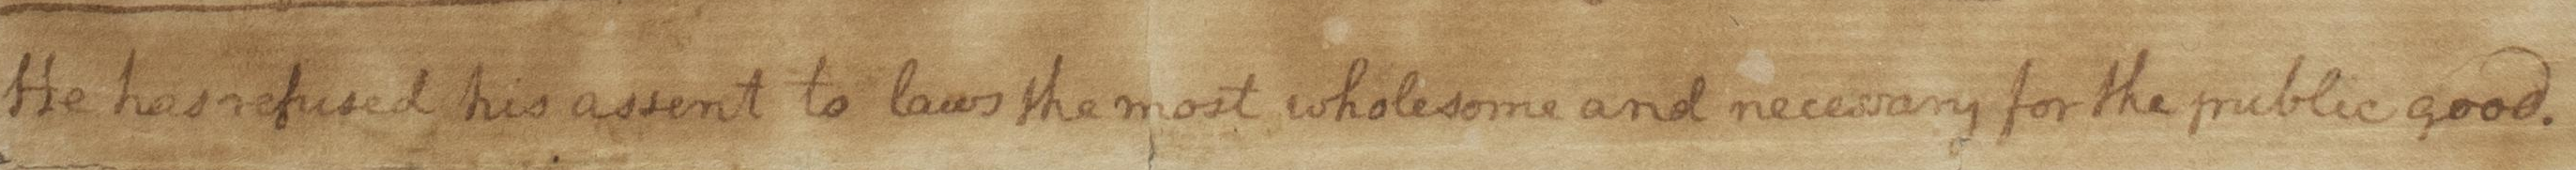he has refused his assent to laws the most wholesome and necessary for the public good
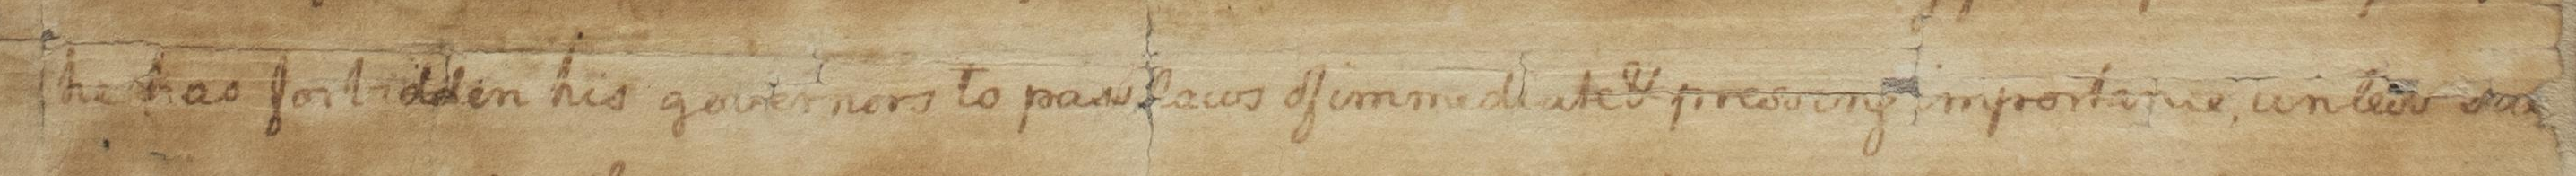he as forbidden his governors to pass laws of immediate & pressing importance unless sus-
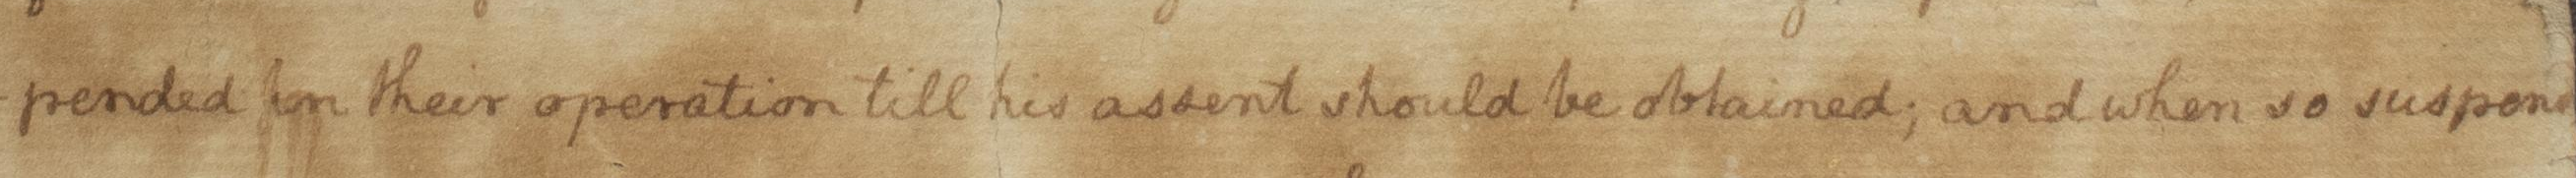-pended in their operation till his assent should be obtained; and when so suspen-
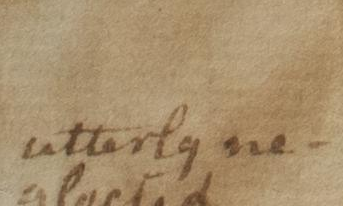utterly ne-
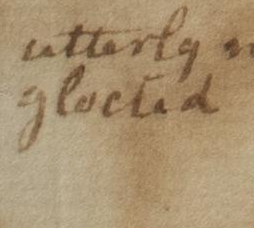glected
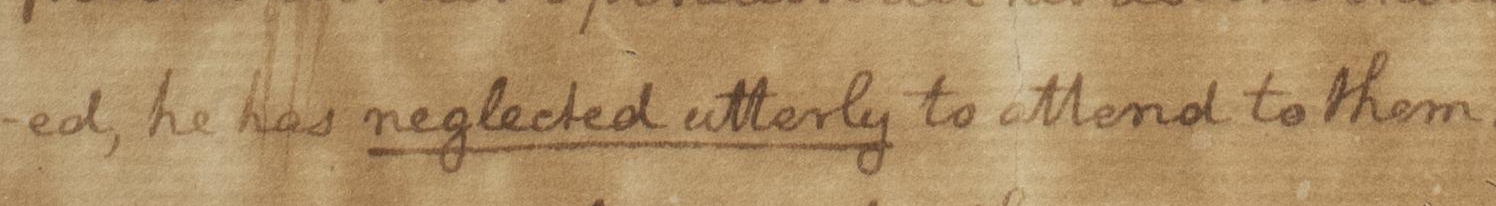ed, he has neglected utterly to attend to them
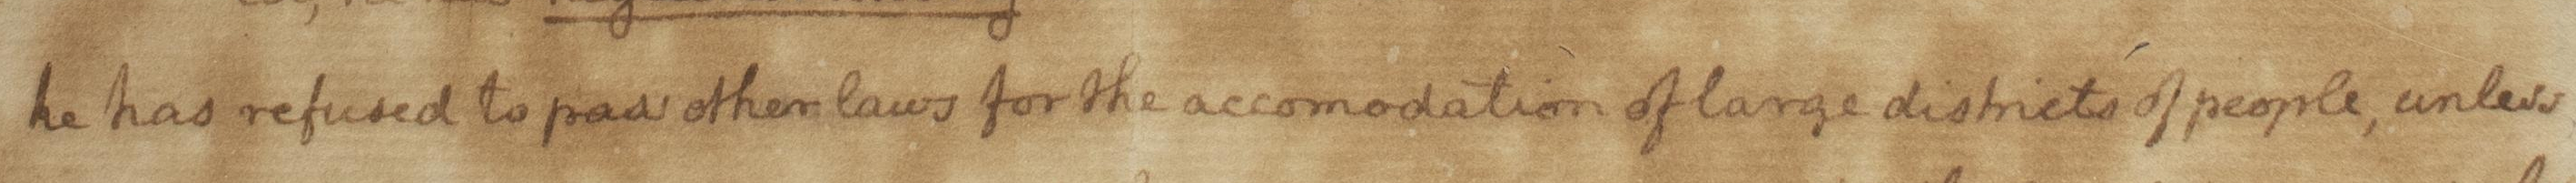he had refused to pass other laws for the accommodation of large districts of people, unless
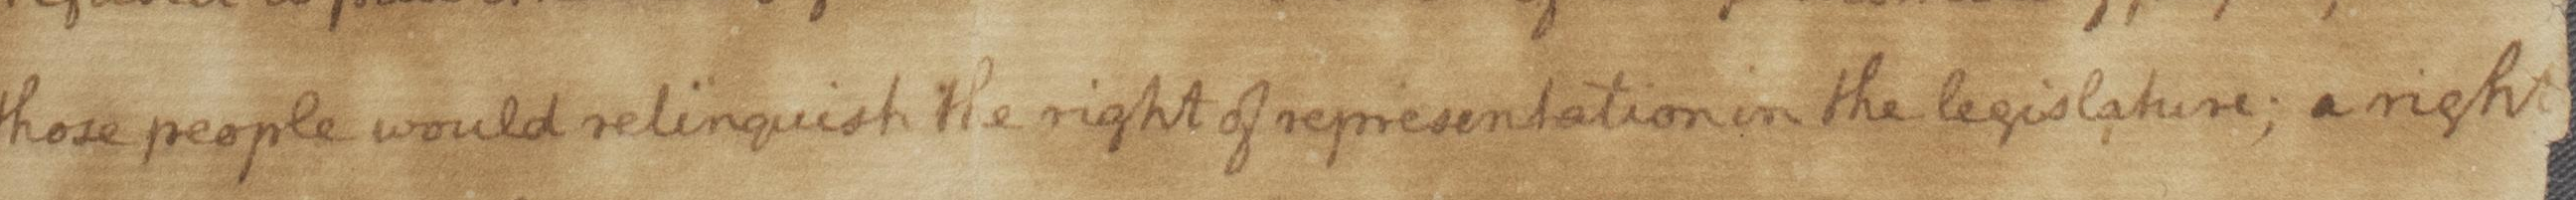those people would relinquish the right of representation in the legislature, a right
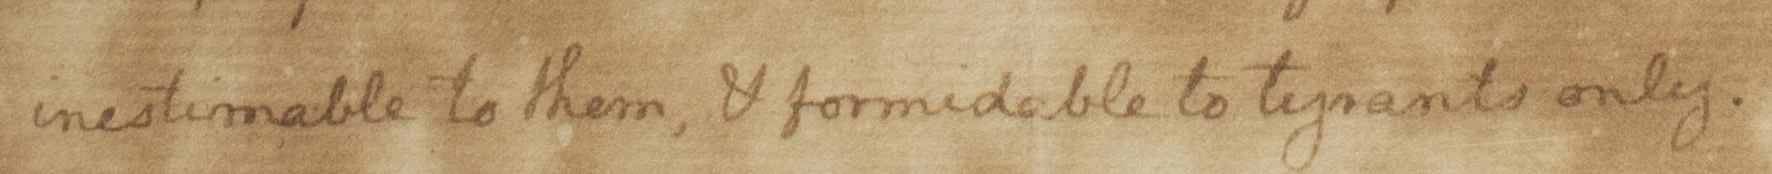inestimable to them, & formidable to tyrants only.
